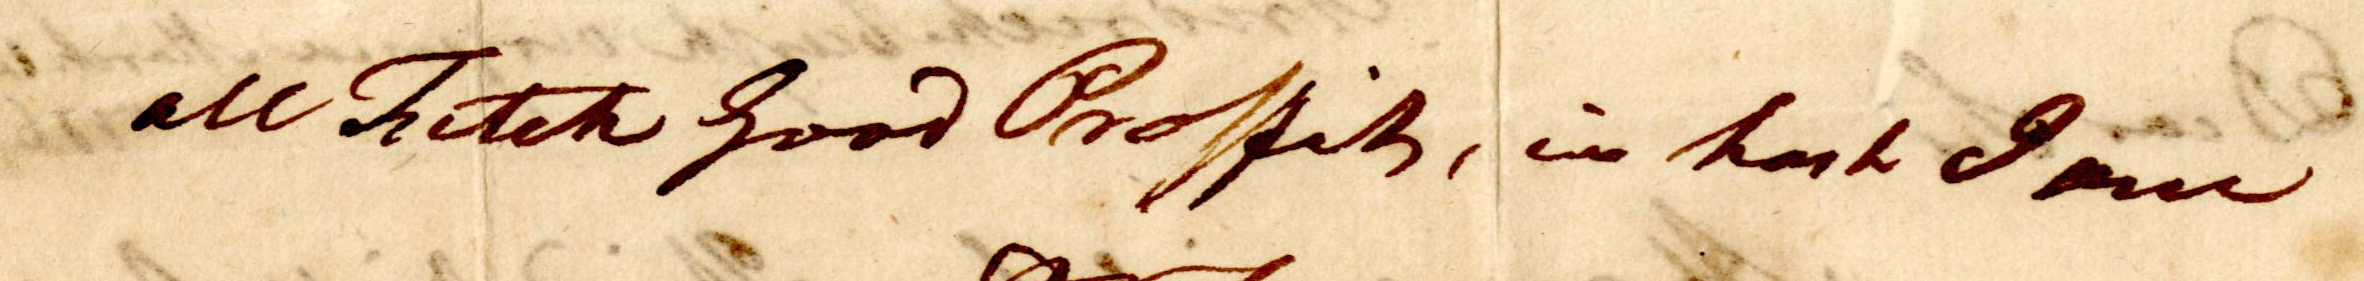all Fetch Good Proffits, in last I am
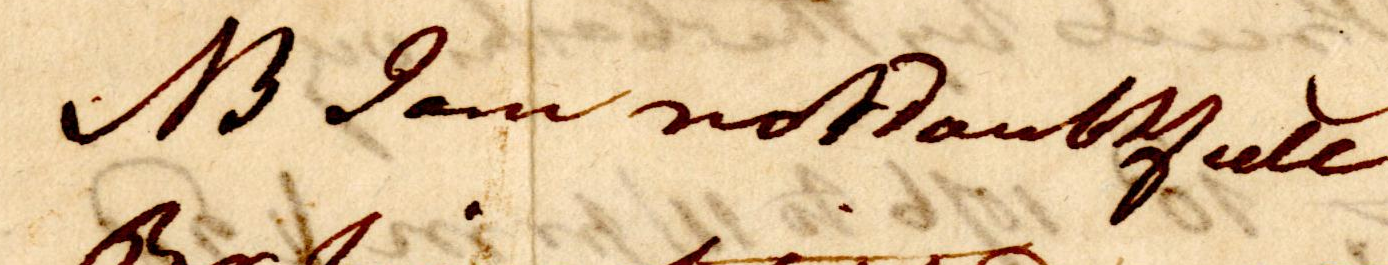NB I am not doubtfull
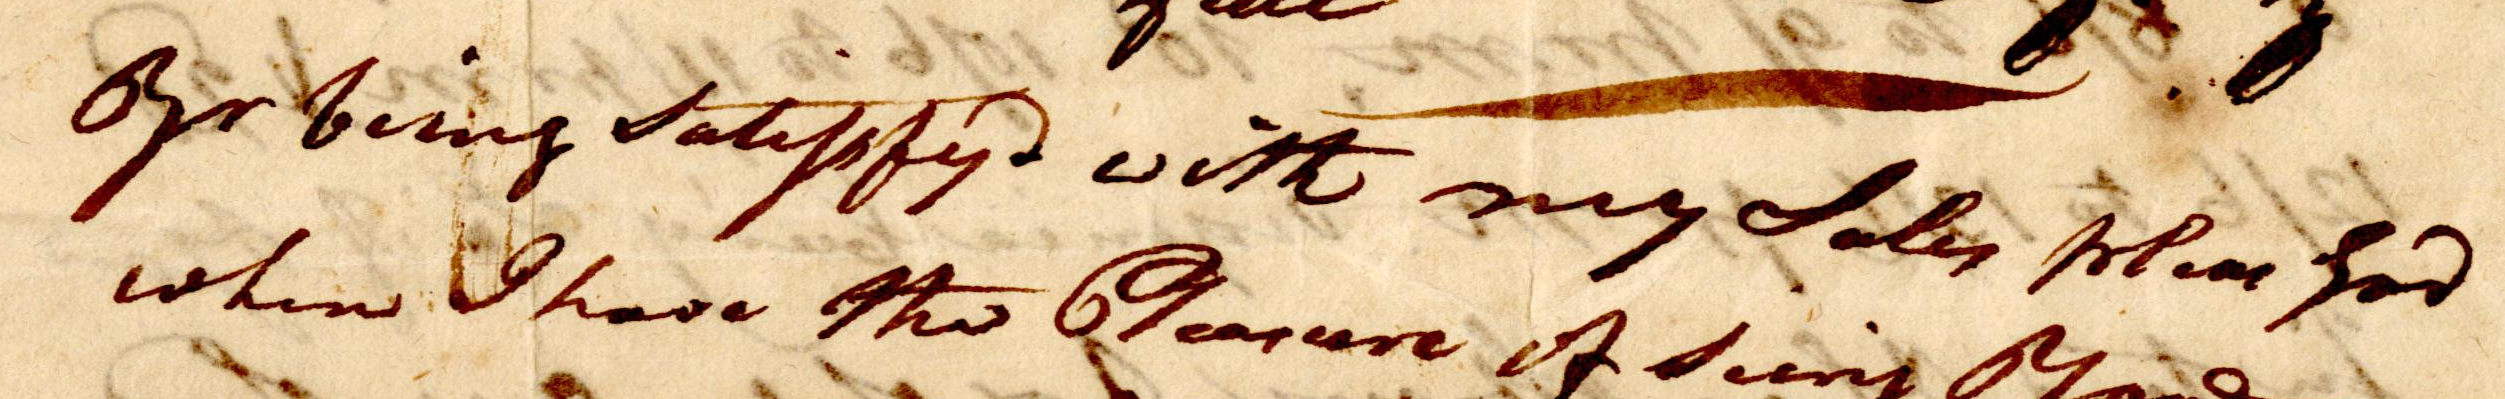Yr being satissfyd with my Sales please Frd
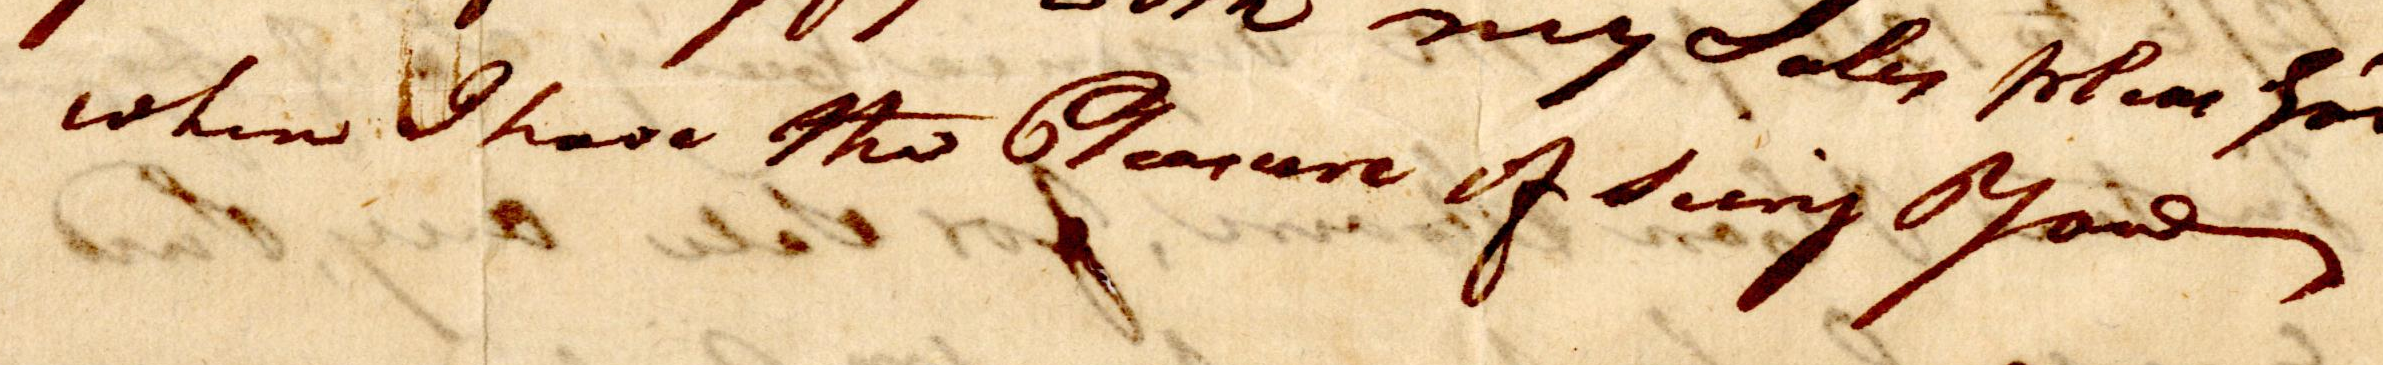when I have the Pleasure of being yours
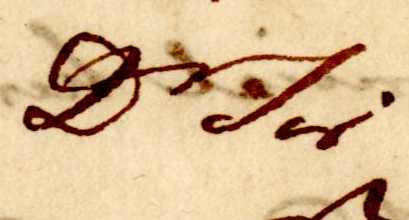D^r Sir
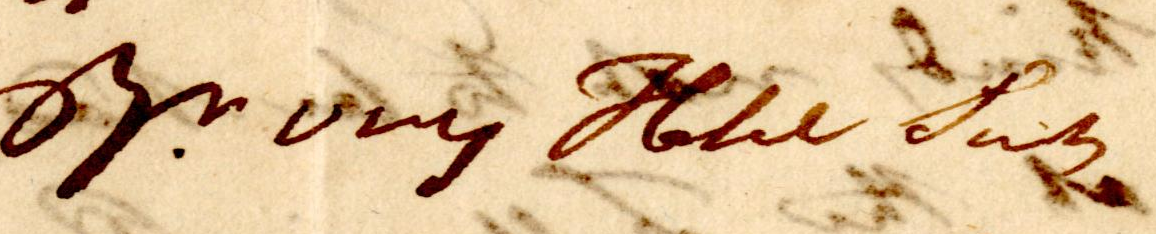y^r very Hb^e Ser
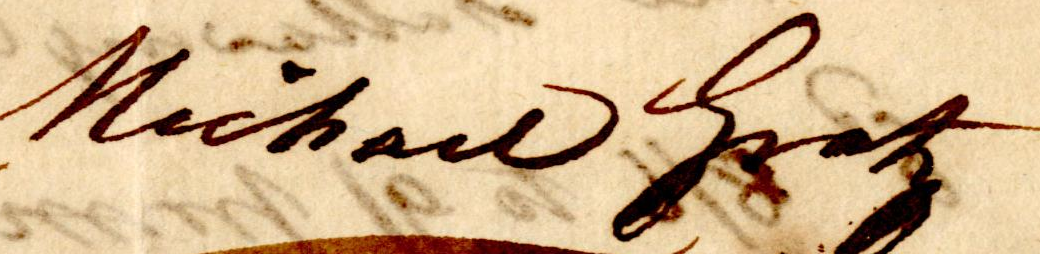Michael Gratz
